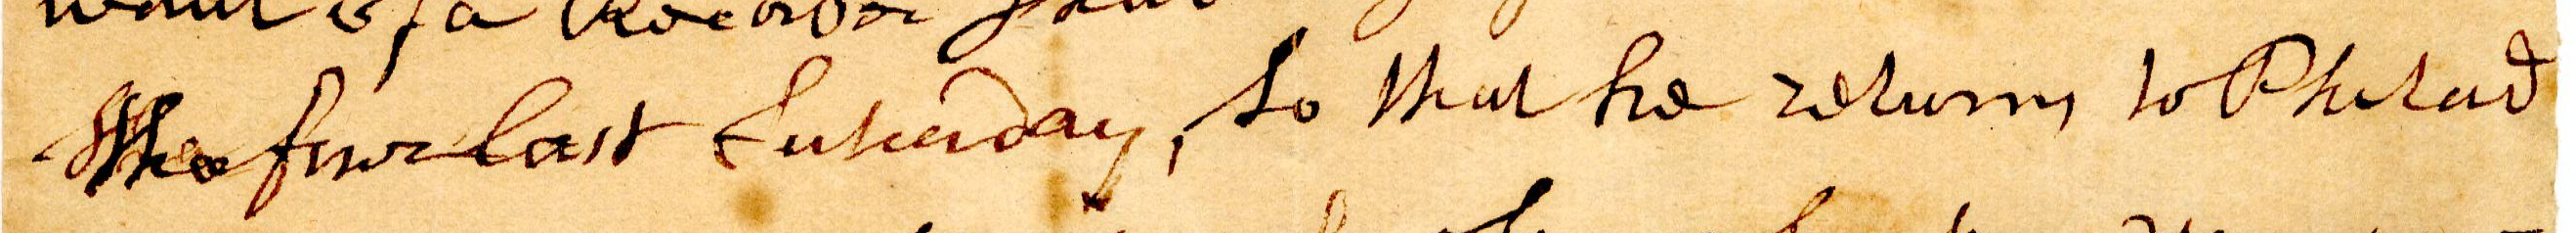He few last Saturday, so that he returns to Philad
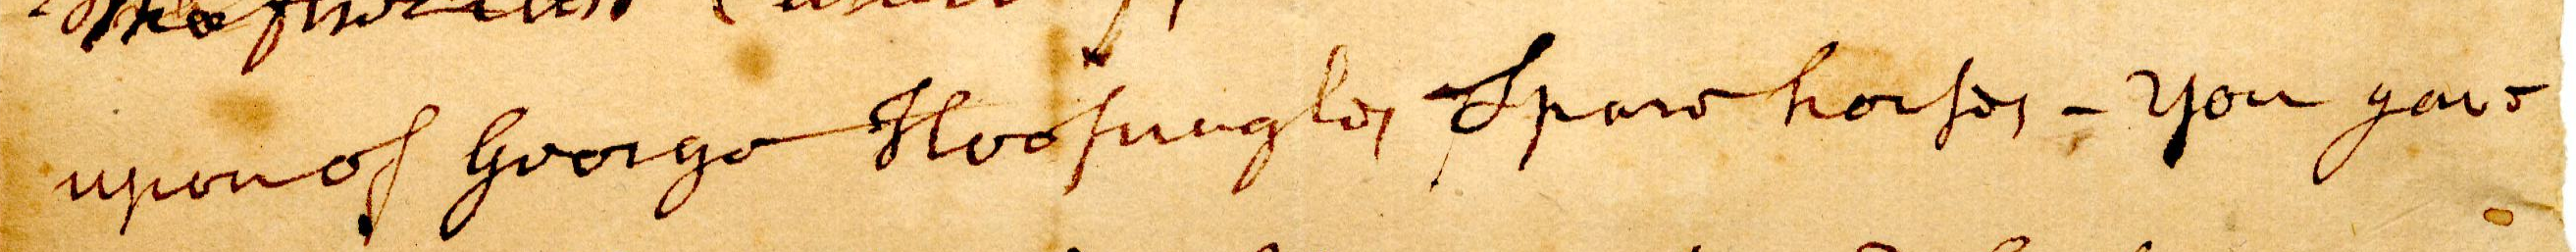upon of George Hoofnagle by Spare horses- You gave
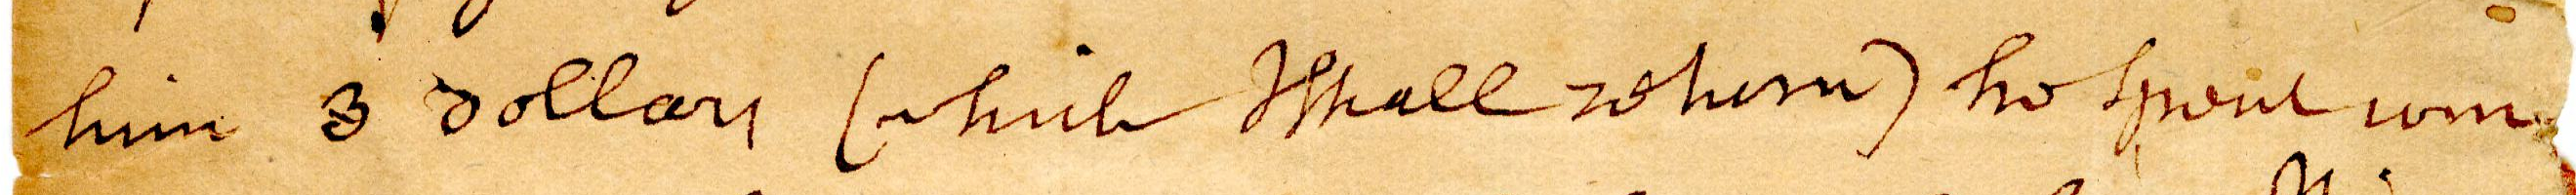him 3 dollars (which I shall return) he spent win
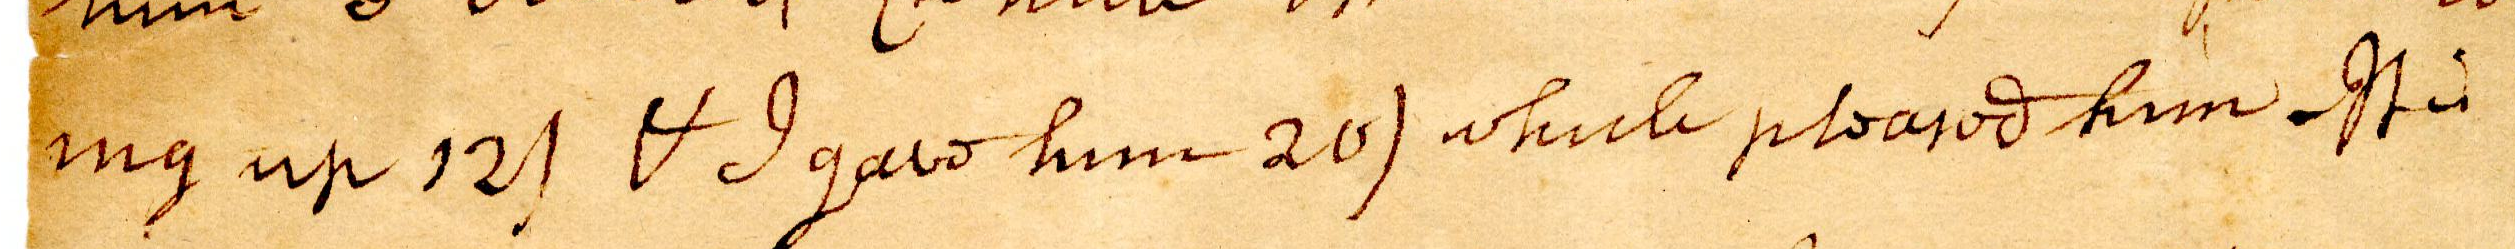ing up 12 ( & I gave him 20) which pleased him. It is
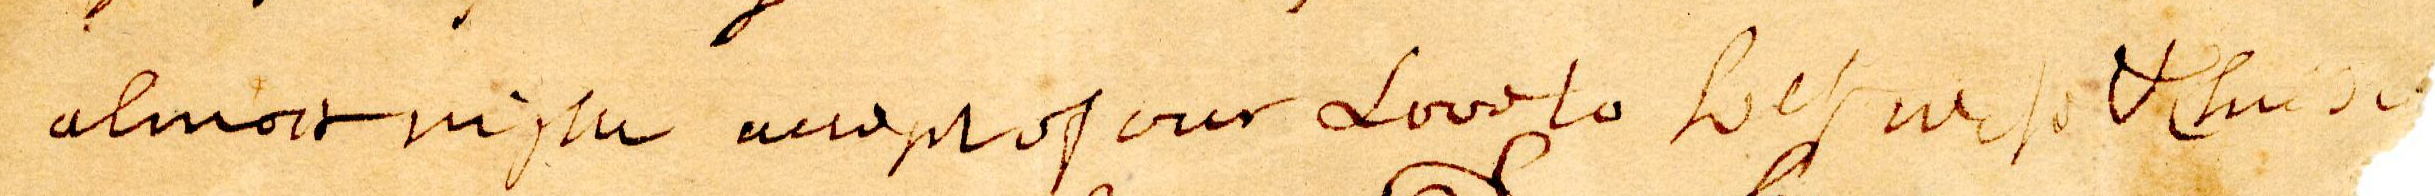almost might accept of our Love to self wife & Child
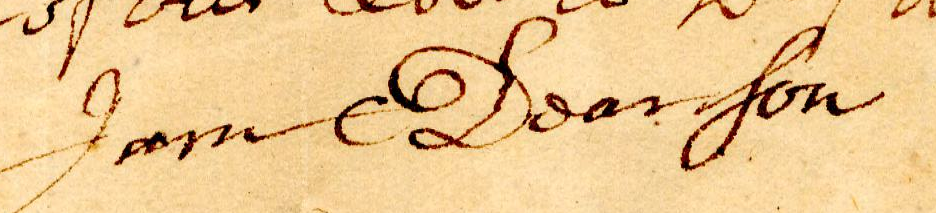I am Dear Son
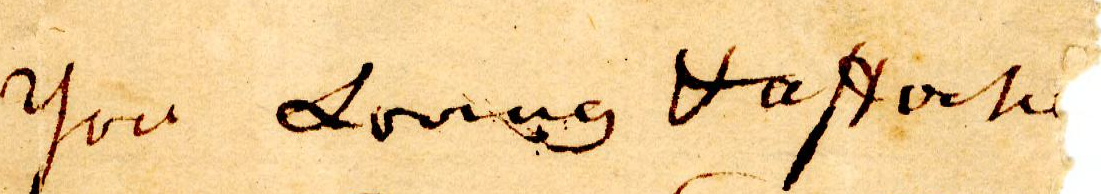you Loving & affecti
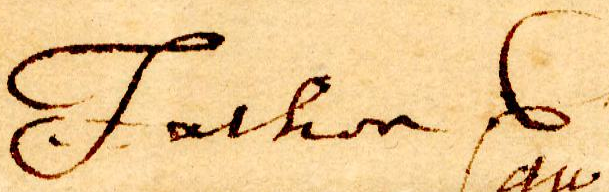Father
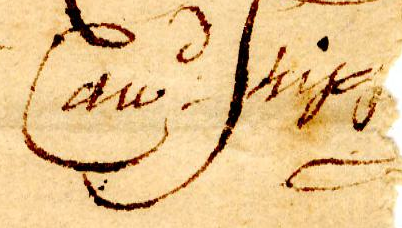Edw^d Ship
